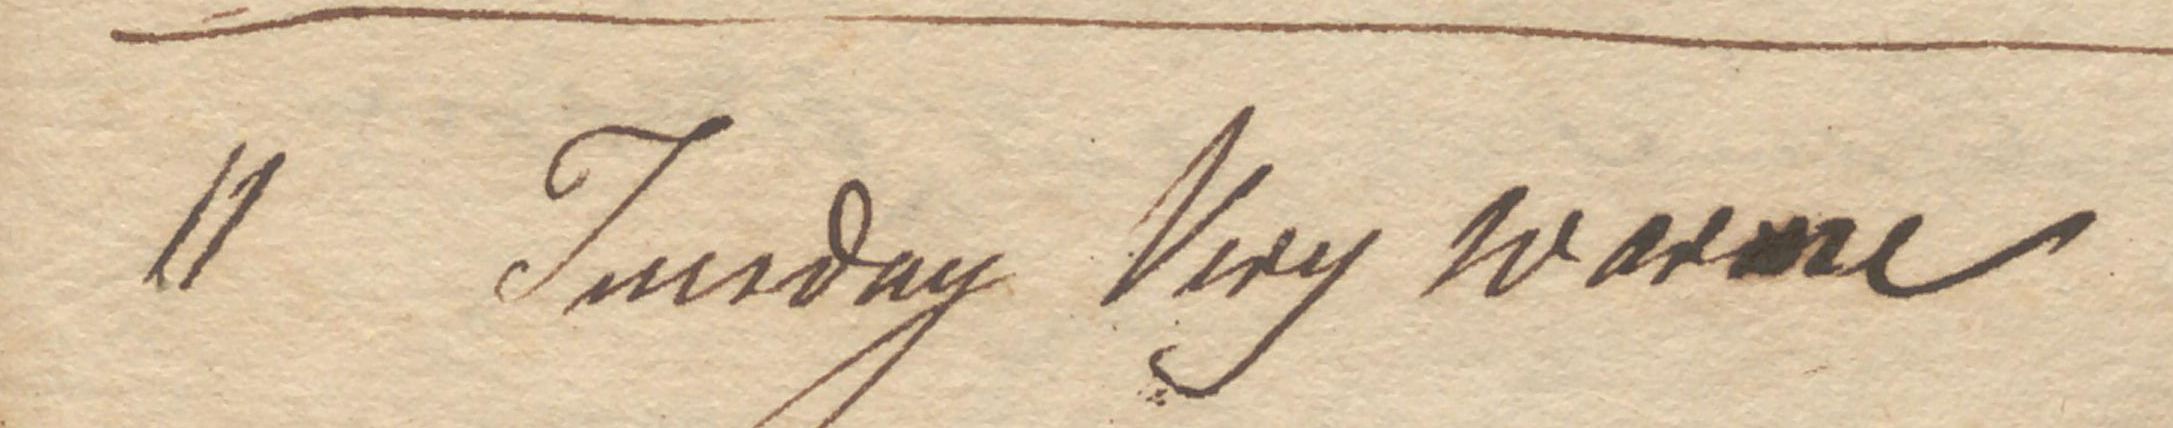11 Tuesday Very warme
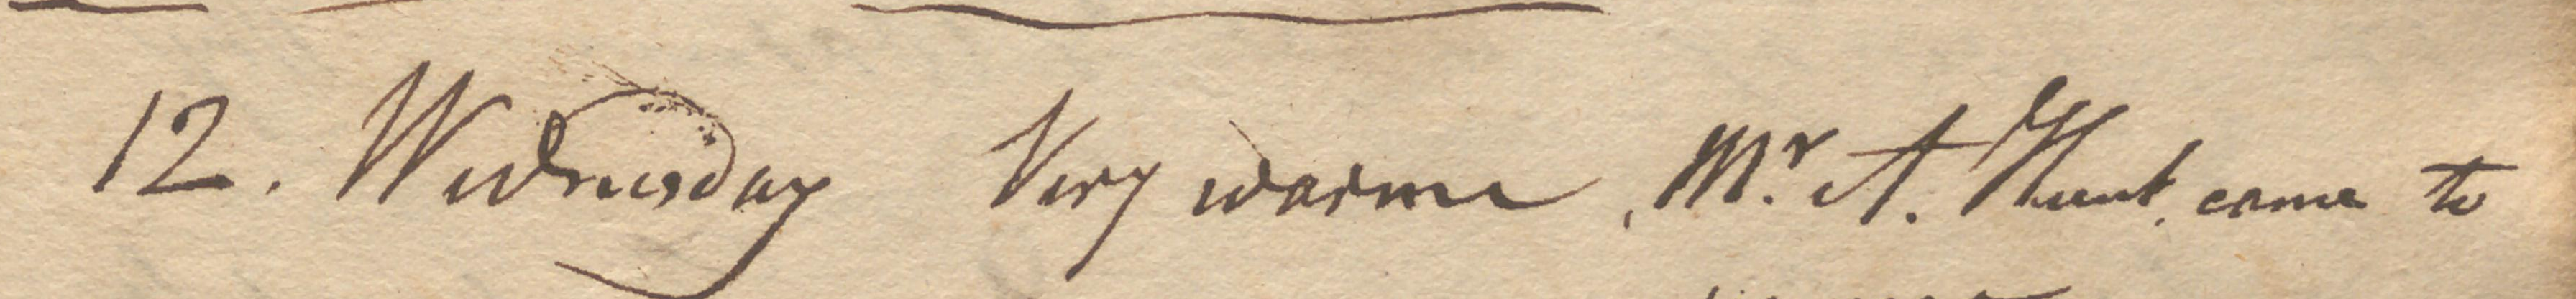12. Wednesday Very warme, M^r. A. Hunt came to
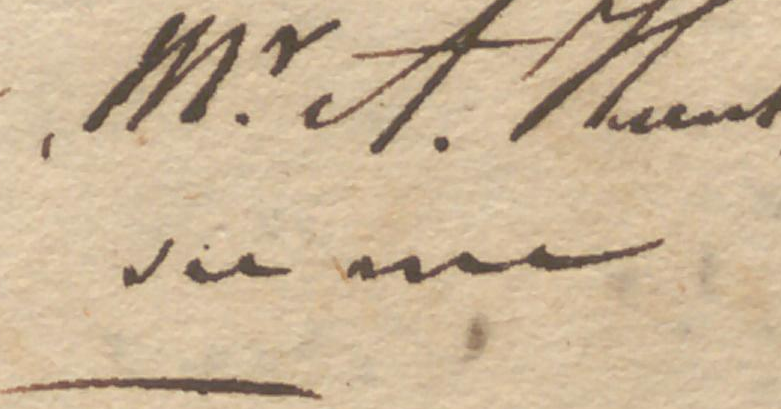see mne
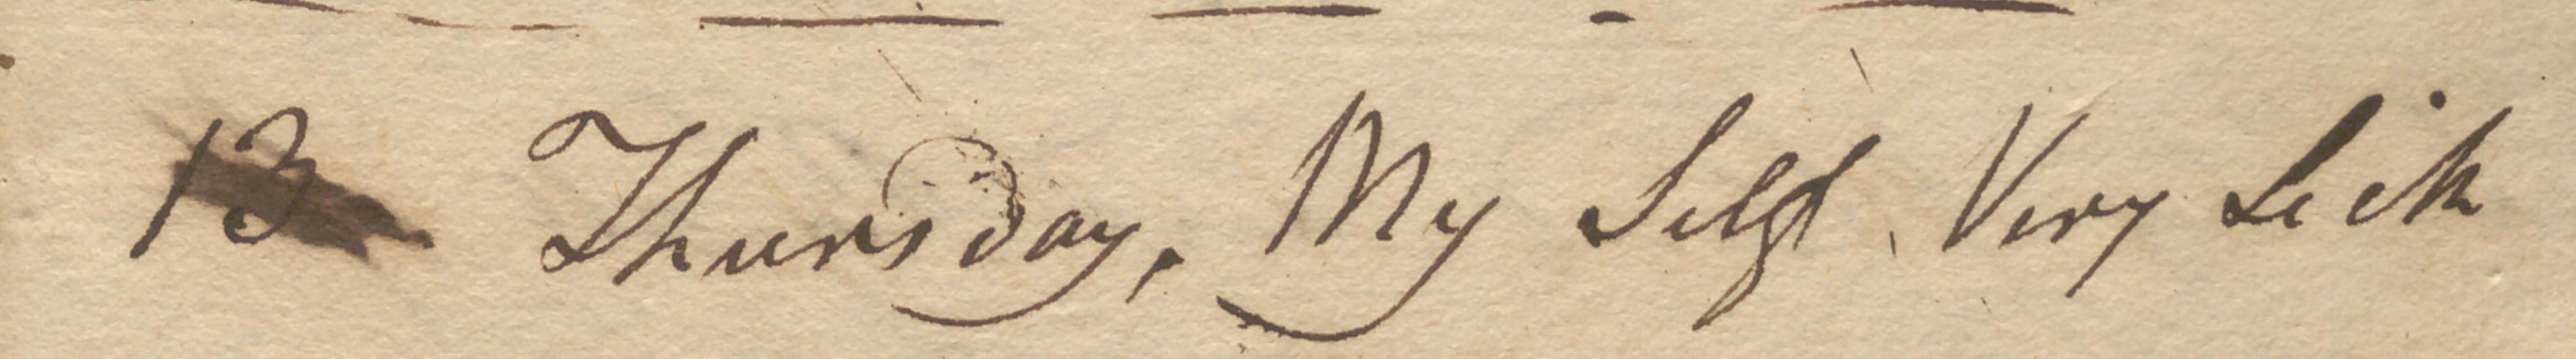13 Thursday, My Self Very sick
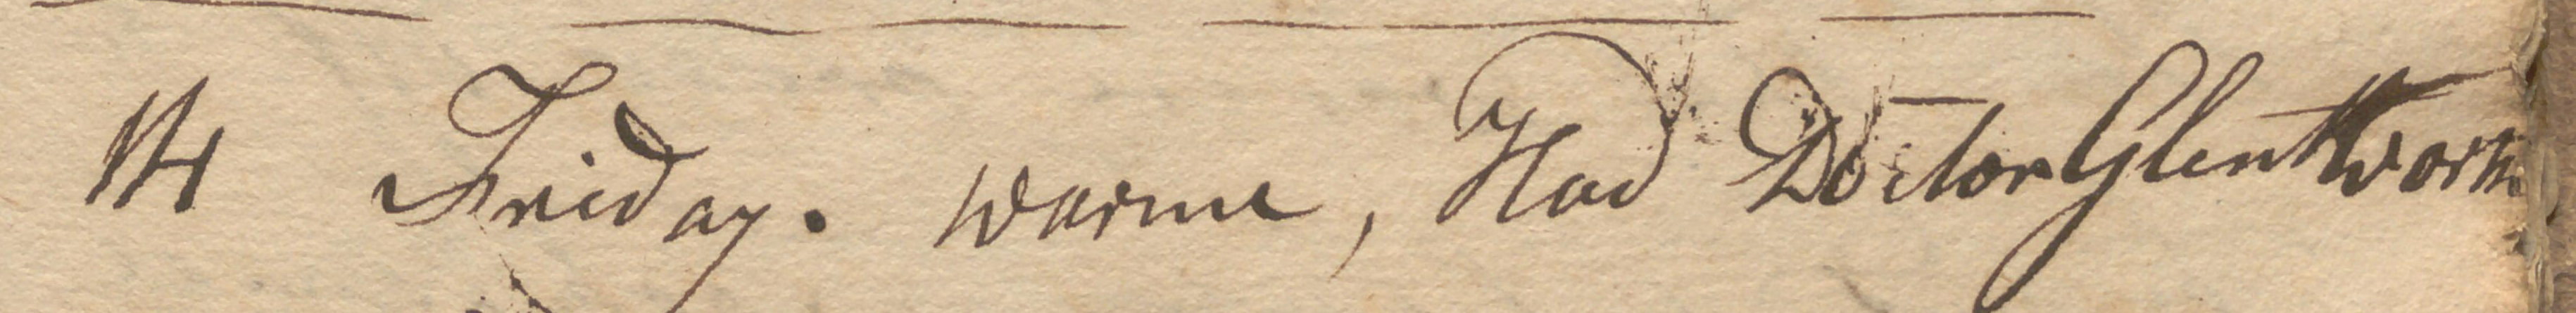14 Friday. warme, Had Doctor Glentworth
